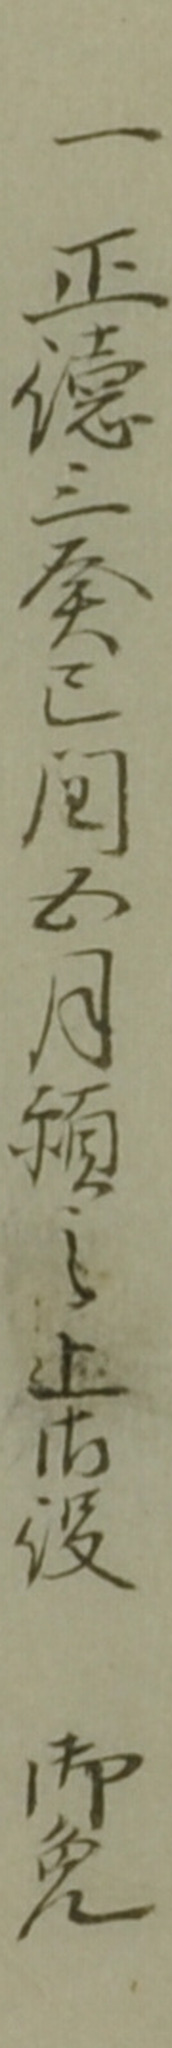一正徳三癸巳閏五月願之上御役御免
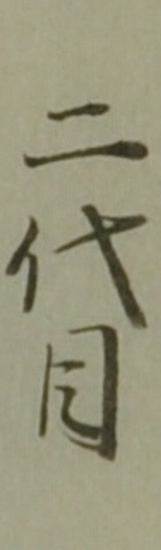二代目
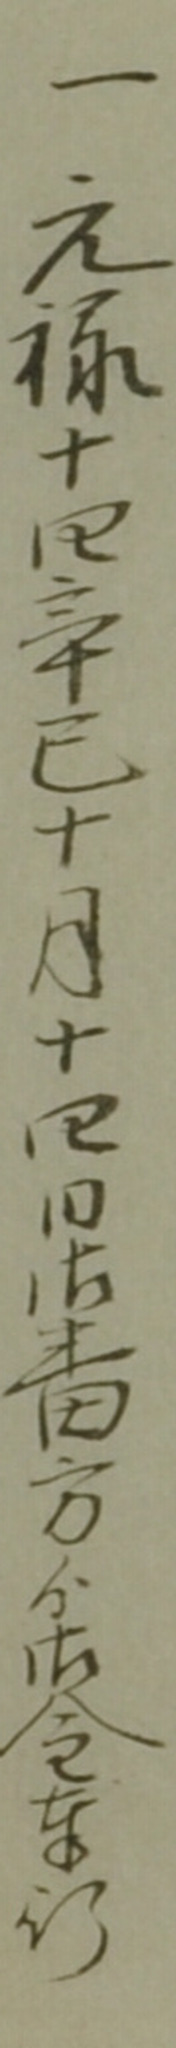一元禄十四辛巳十月十四日御番方ゟ御金奉行
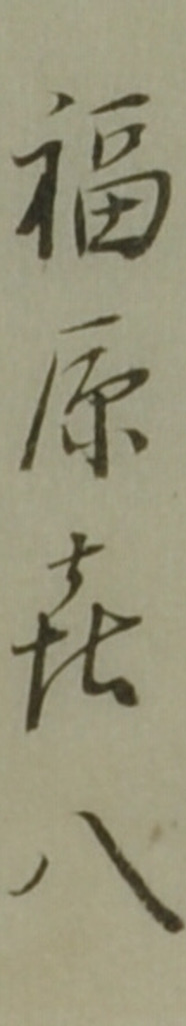福原喜八
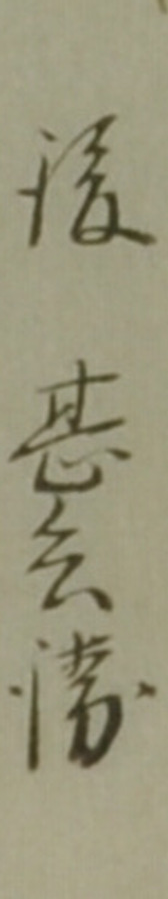後甚兵衛
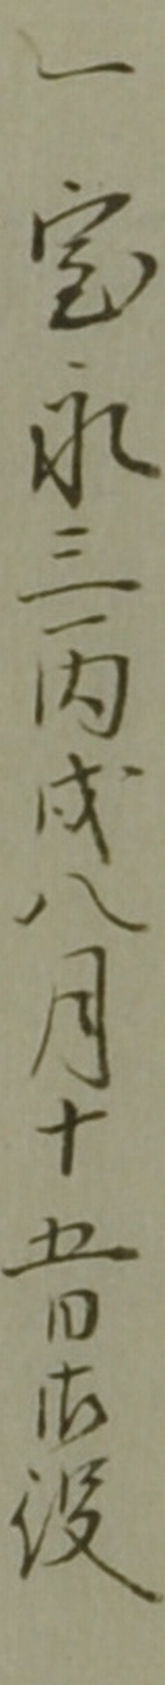一宝永三丙戌八月十五日御役
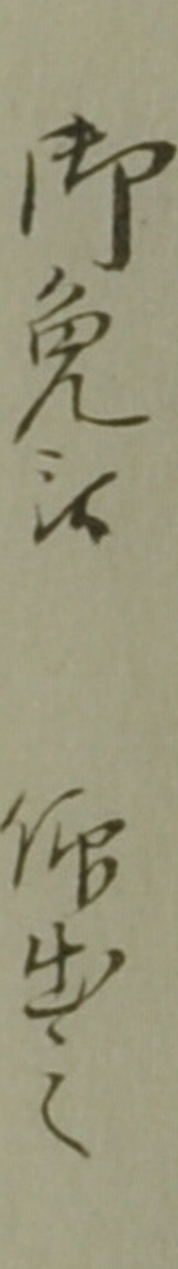御免被仰出之
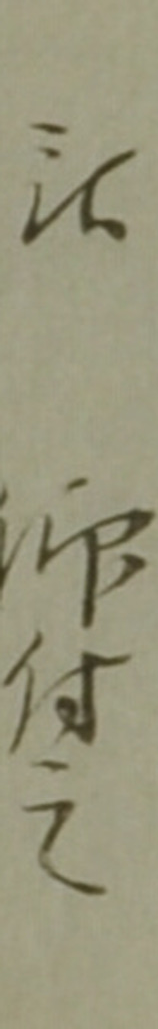被仰付之

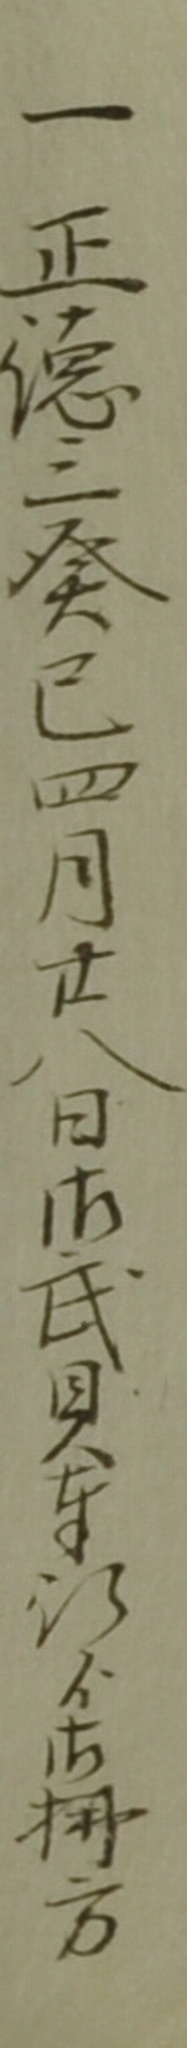一正徳三癸巳四月廿八日御武具奉行ゟ御払方
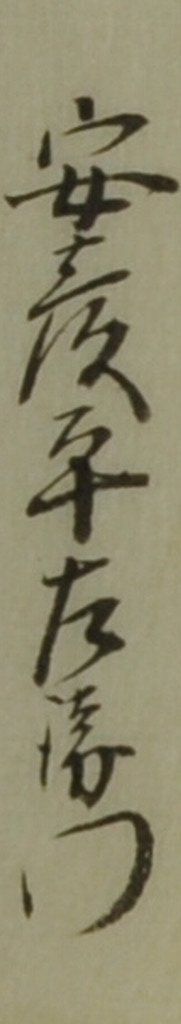安彦平左衛門
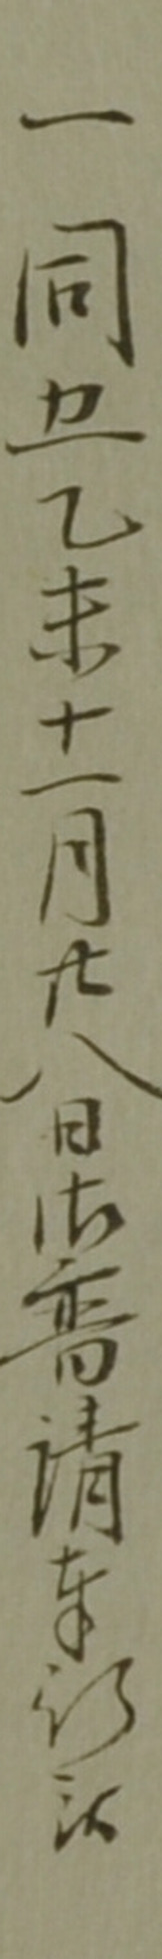一同五乙巳十一月廿八日御普請奉行被
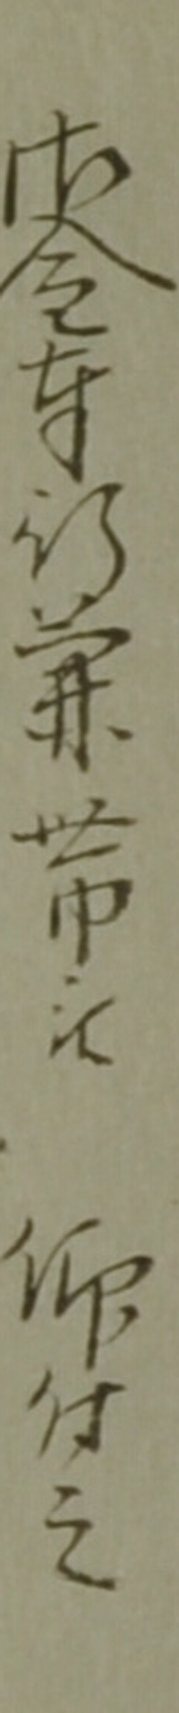御金奉行兼帯被仰付之
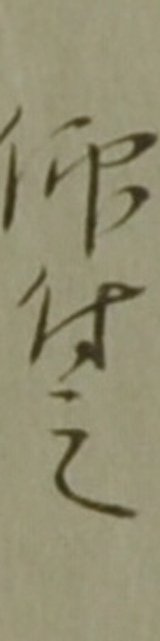仰付之
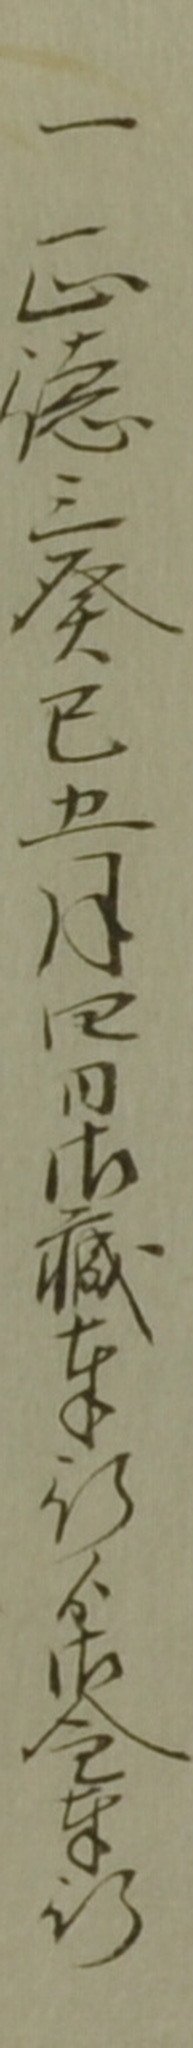一正徳三癸巳五月四日御蔵奉行ゟ御金奉行
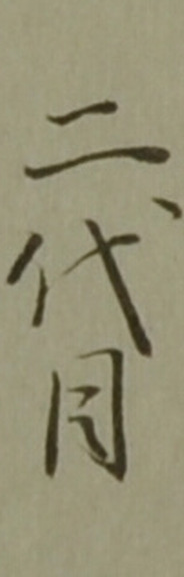二代目
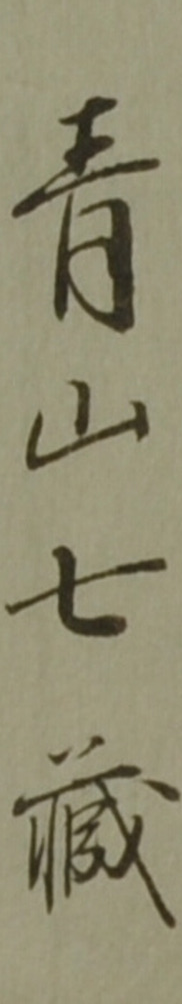青山七蔵
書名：諸御役代々録（七）
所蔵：伊那市立高遠町図書館・合同会社AMANE
